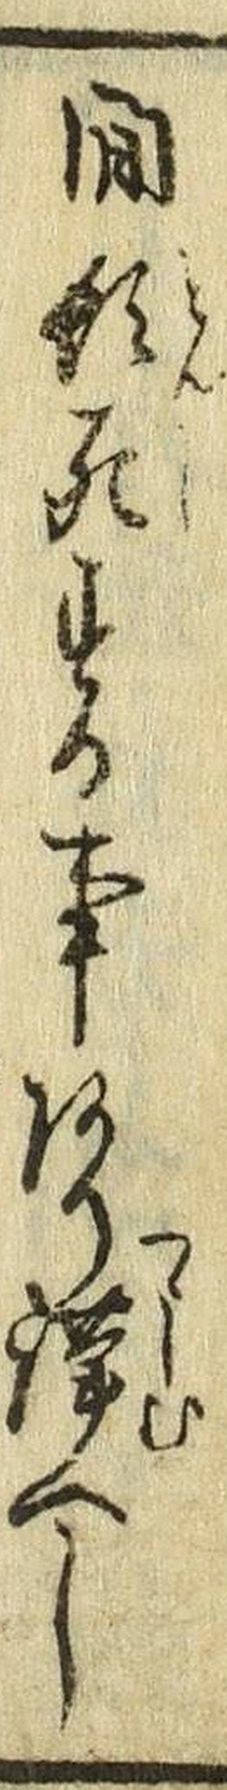間頓死する事あり謹へし
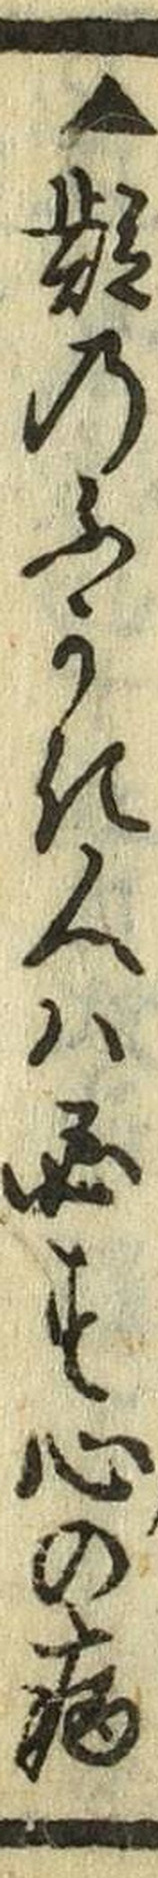▲疑のふかき人は必す心の病
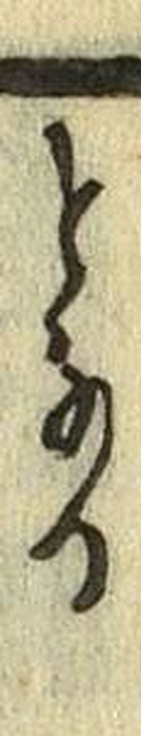となる
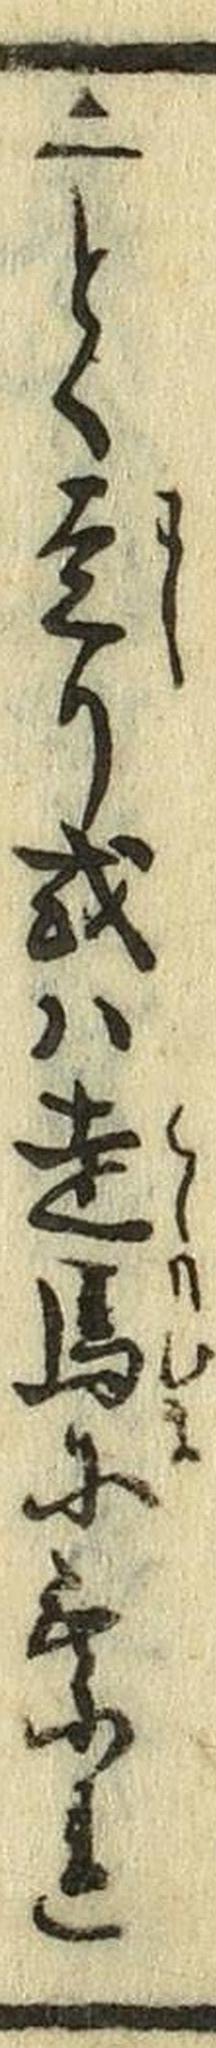△とく走り或は走馬に乗れ
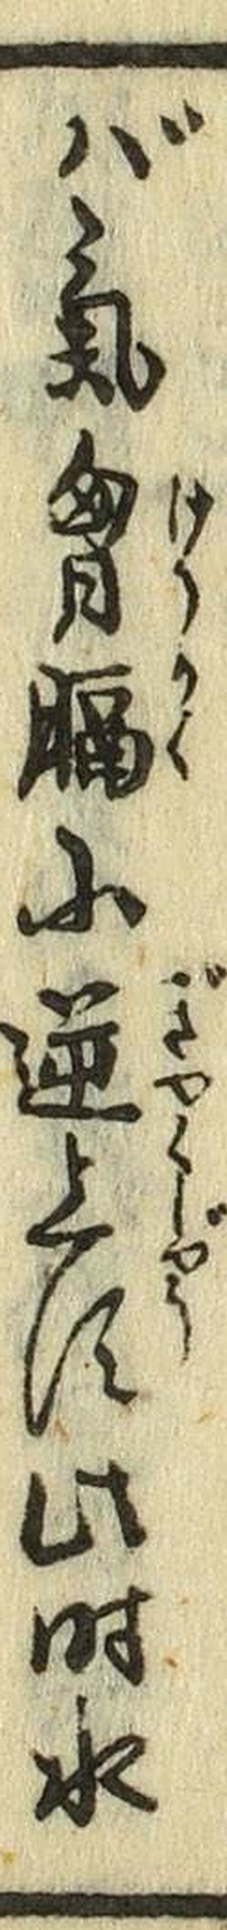ば気胸郭に逆上す此時水
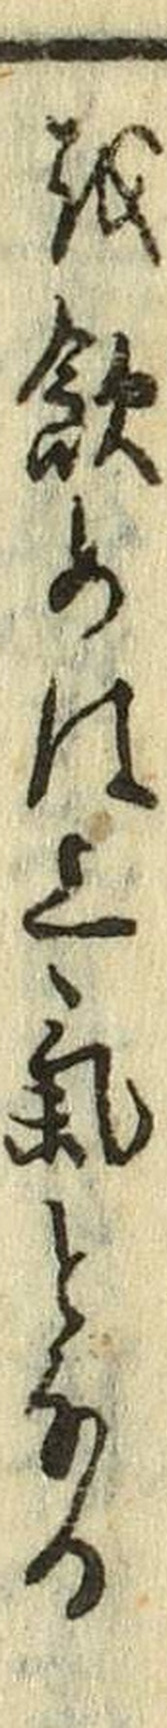を飲めは上気となる
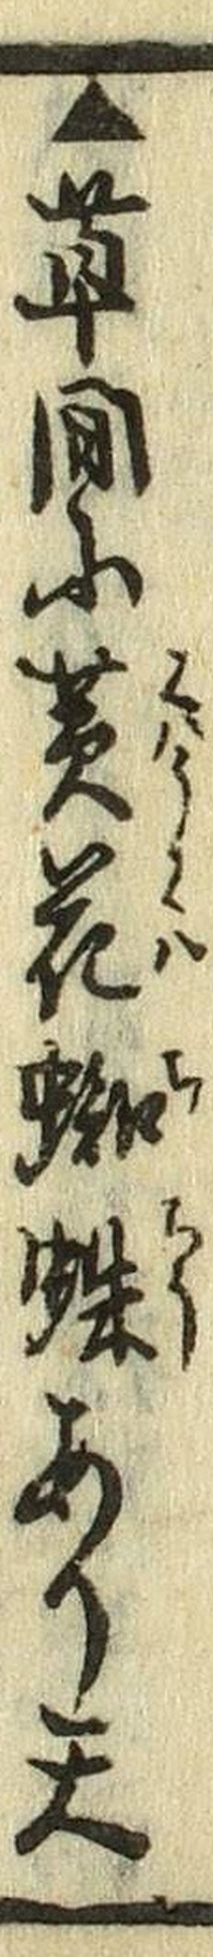▲草間に黄花蜘蛛あり天
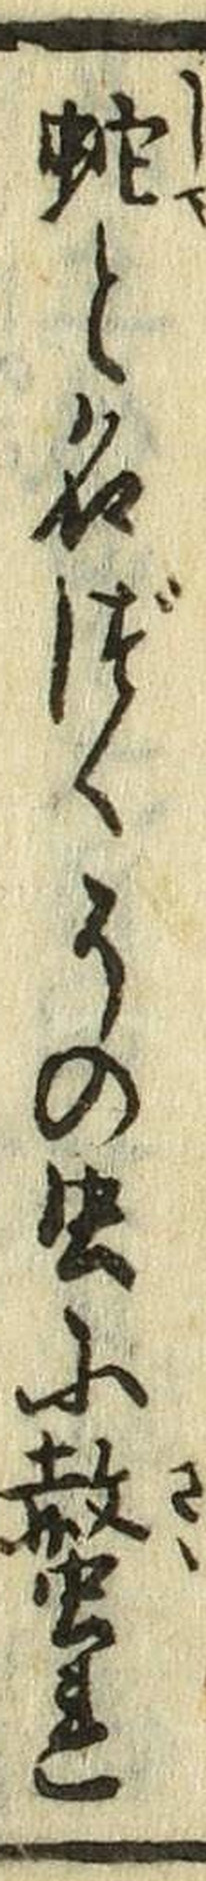蛇と名づくその虫に螫れ
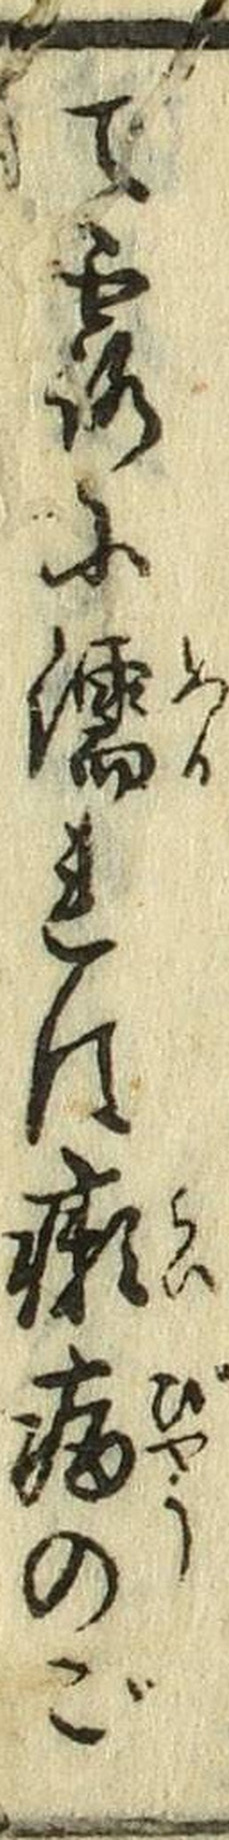て露に濡れは癩病のご
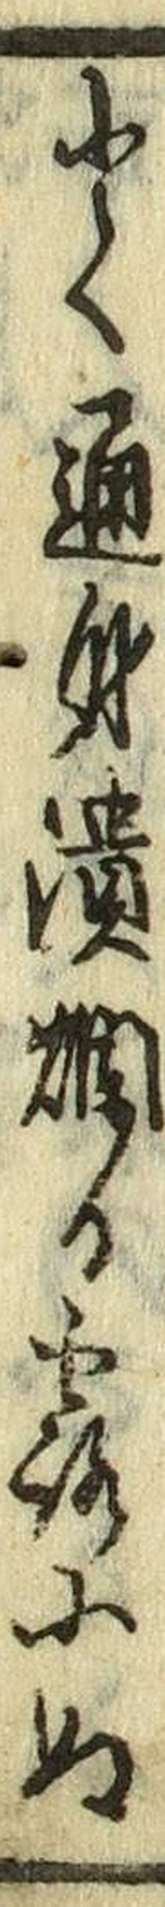とく通身潰爛る露にぬ
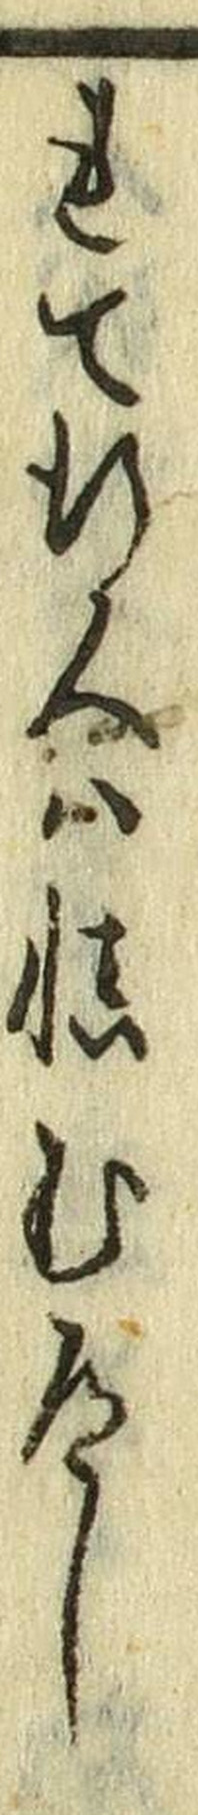れて行人は慎むへし
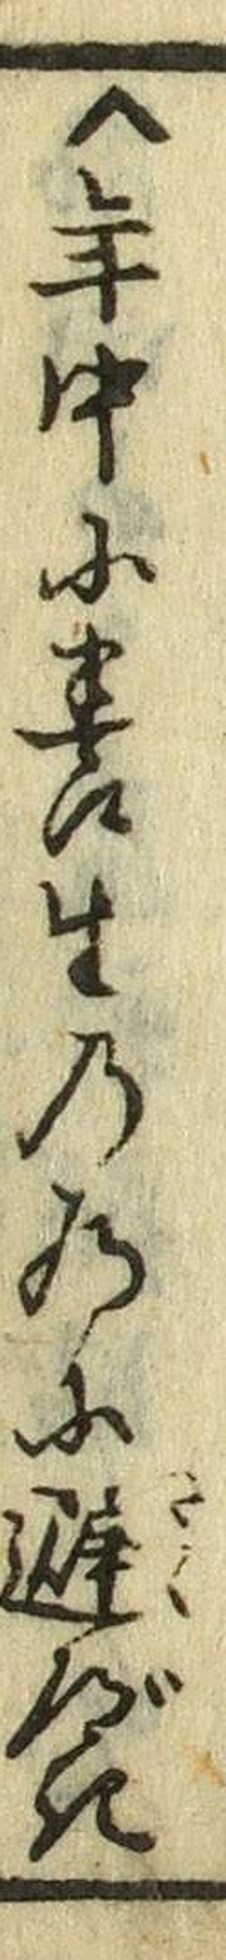△年中に養生の為に避べき

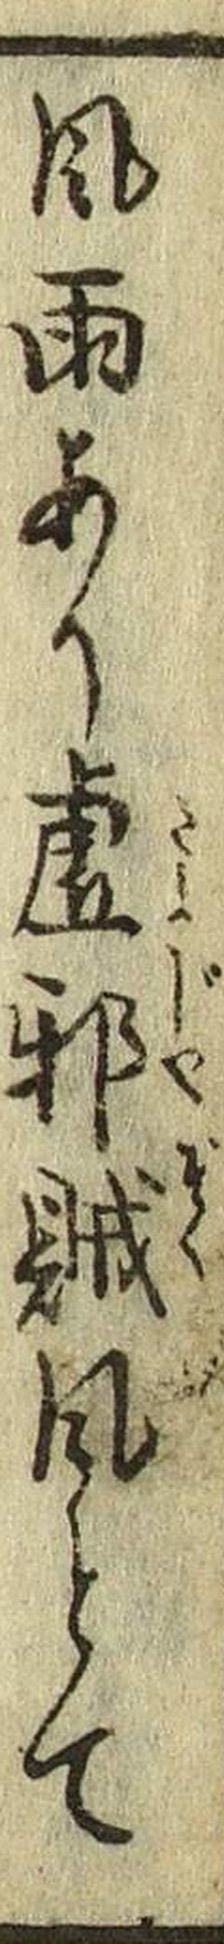風雨あり虚邪賊風とて
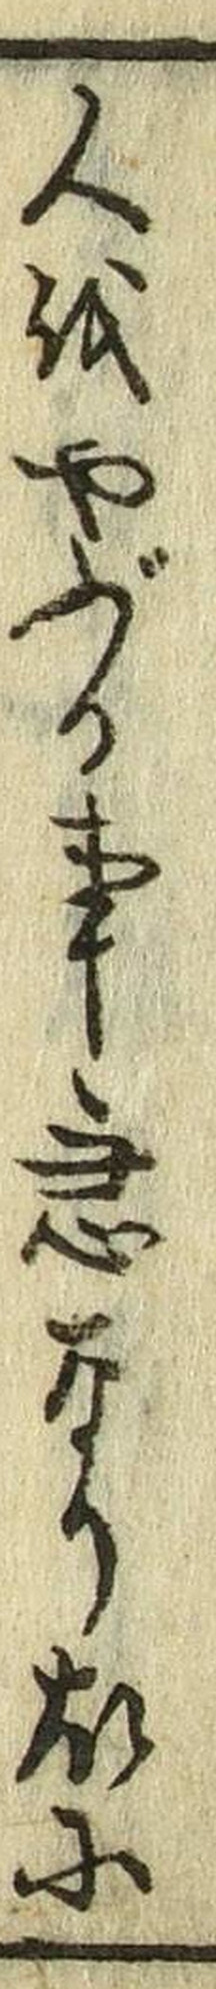人をやぶる事急なり故に
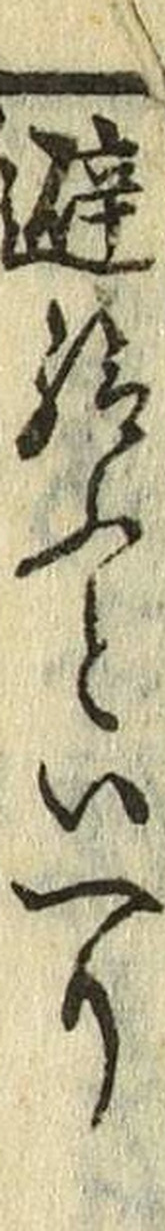避給ふといへり
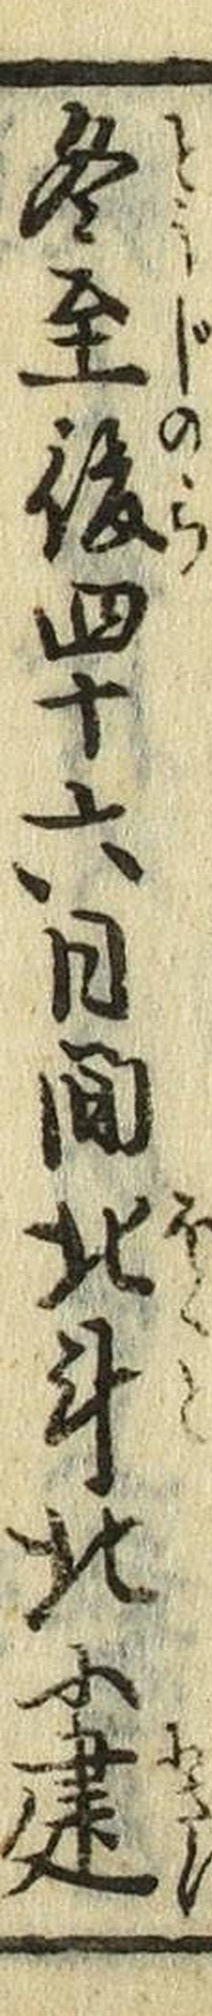冬至後四十六日間北斗北に建
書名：居家養生記
